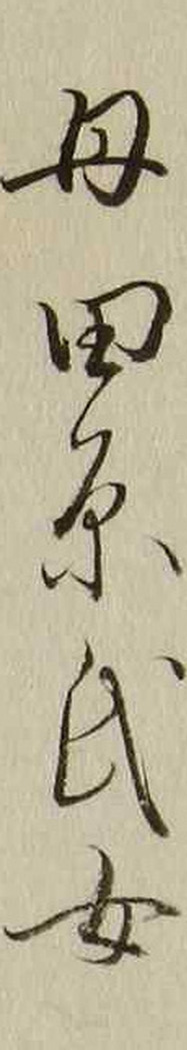母田原氏女
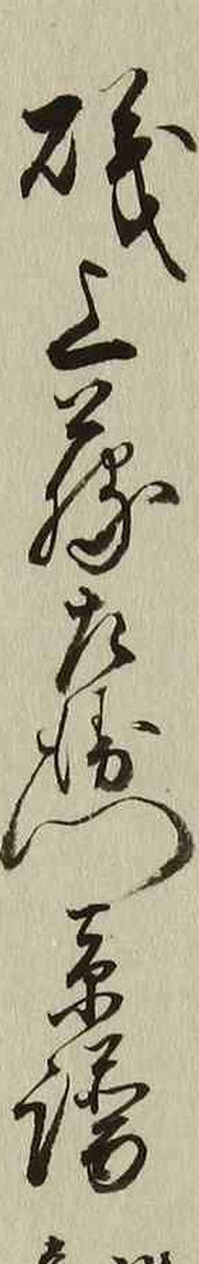磯上藤右衛門定重
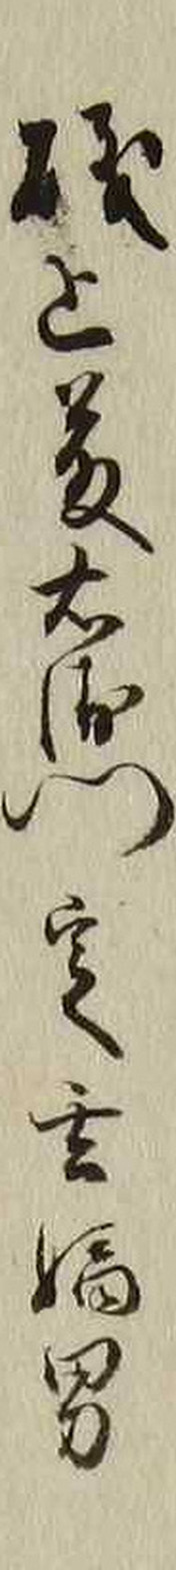磯上藤右衛門定玄嫡男
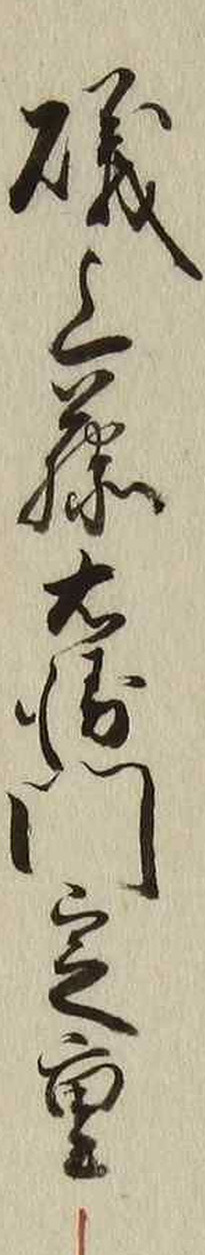磯上藤右衛門定重
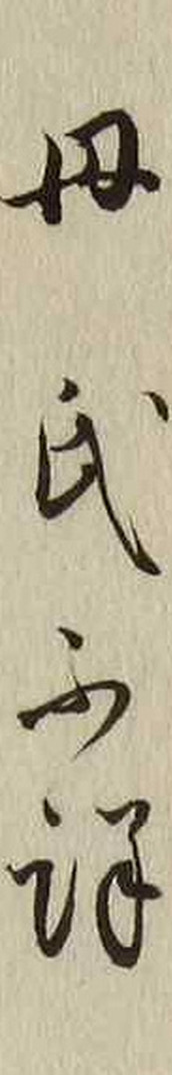母氏不詳
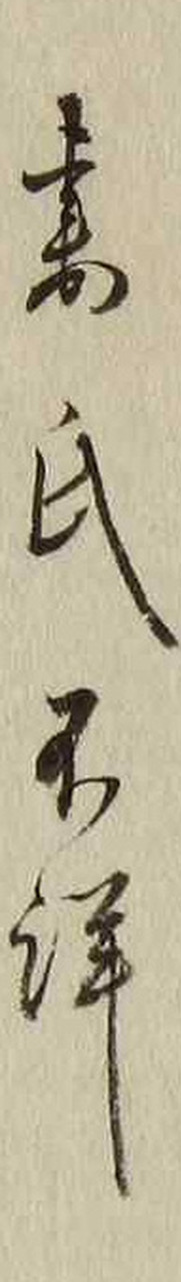妻氏不詳
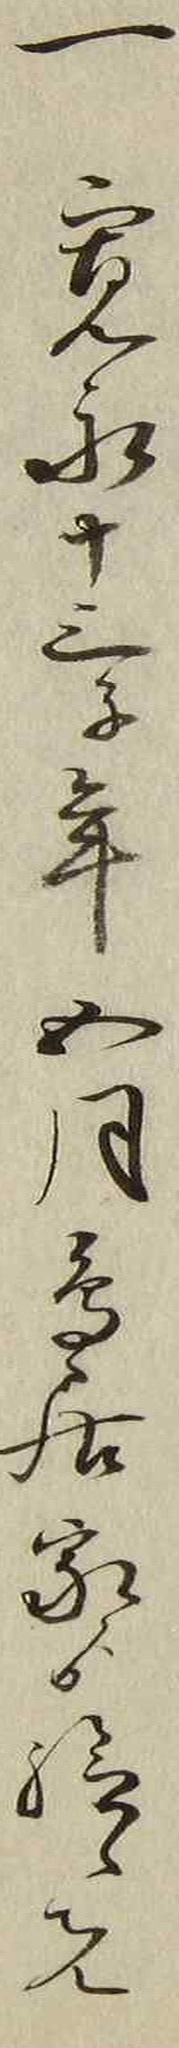一寛永十三子年五月鳥居家ゟ給候先
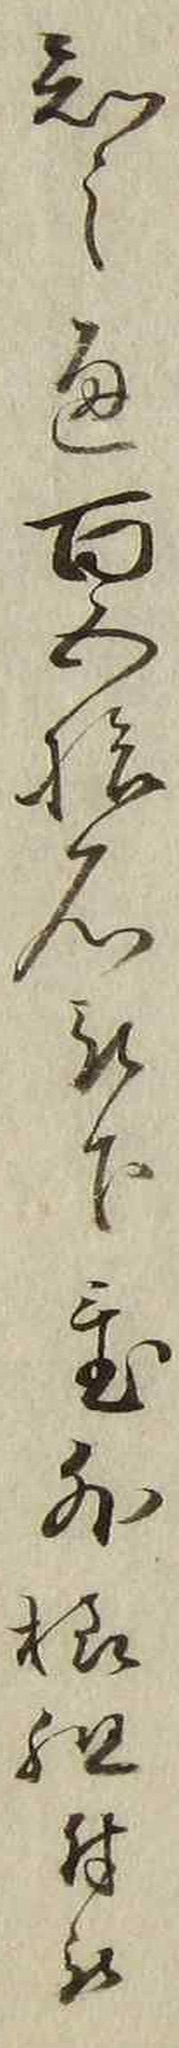知之通百五拾石被下置外様組付被
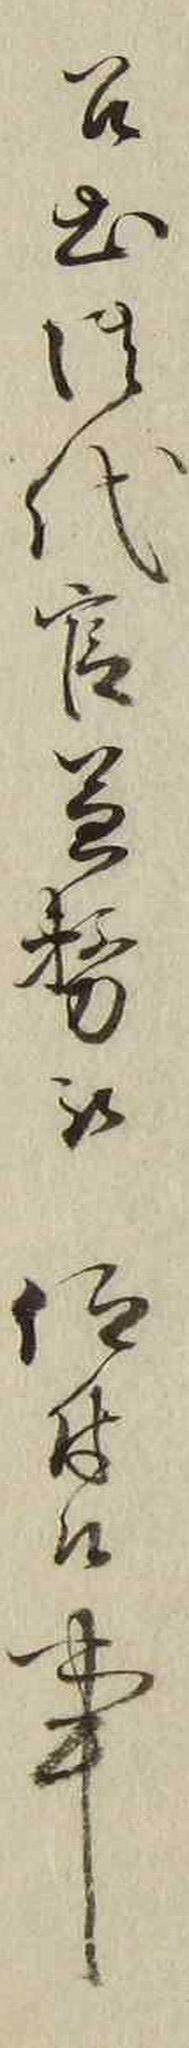召出御代官兼務被仰付候事

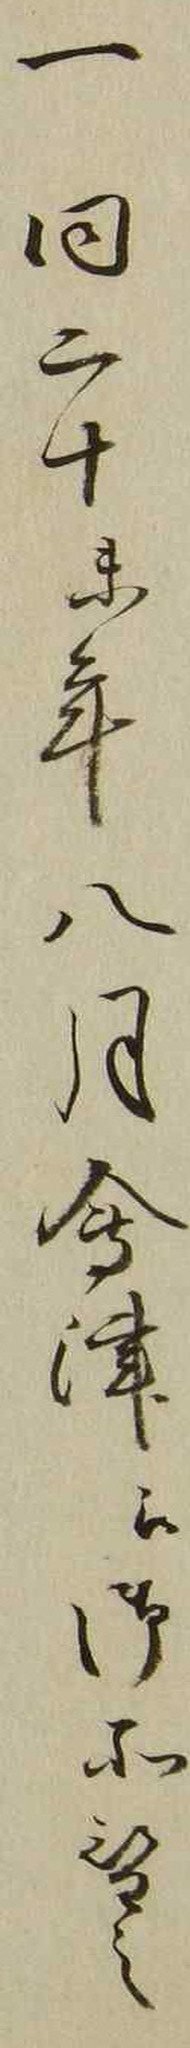一同二十未年八月会津江御所替之
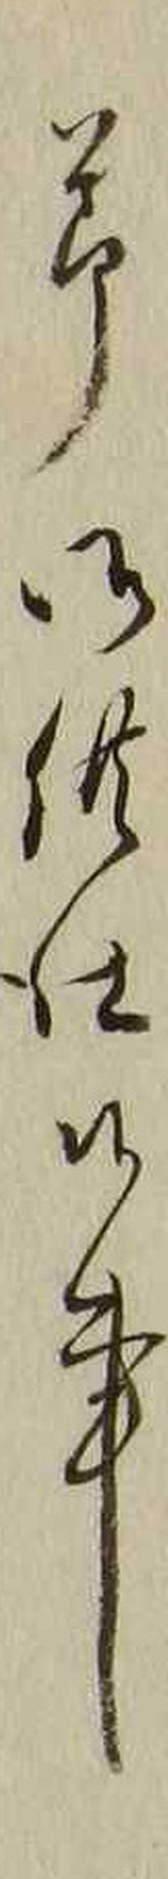節御供仕候事
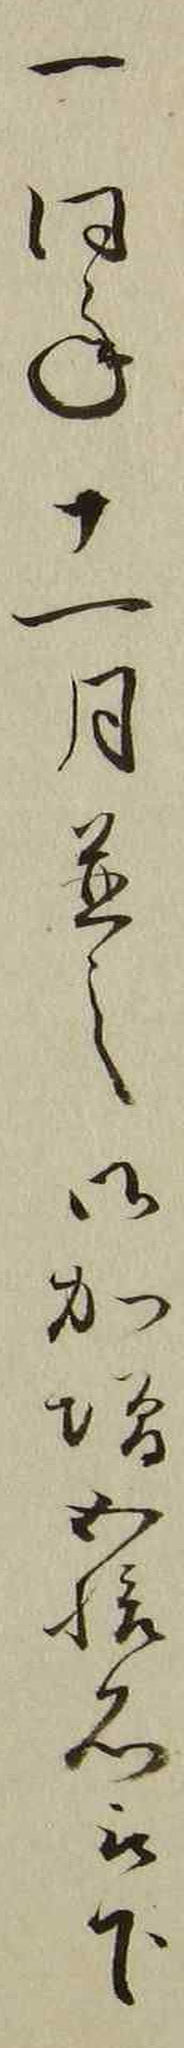一同年十一月並之御加増五拾石被下
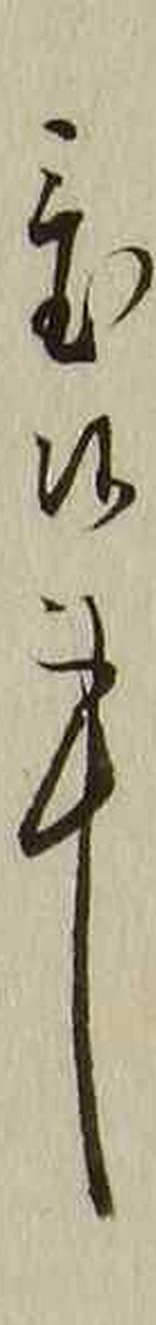置候事
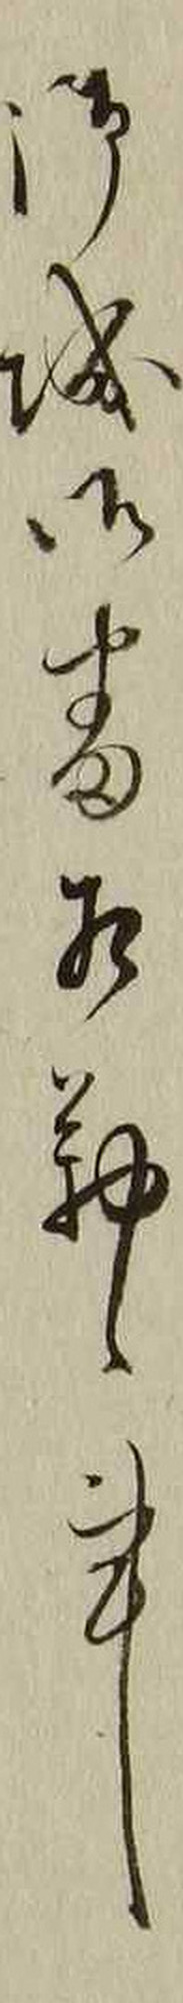御城御番相勤候事
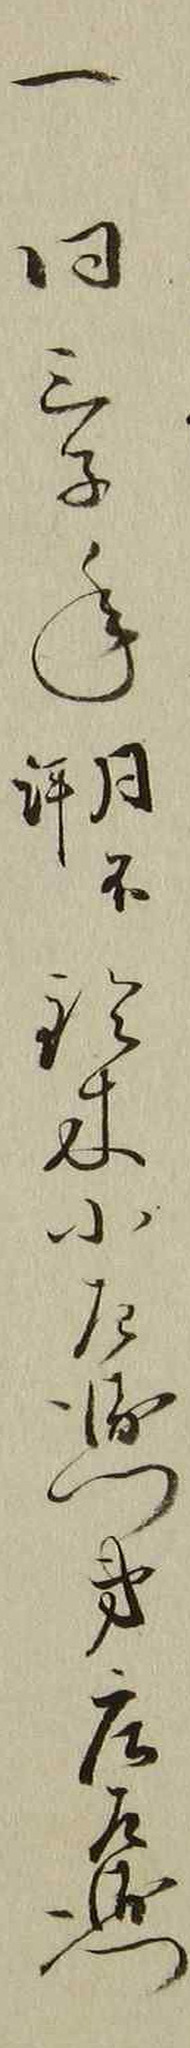一同三子年月不詳鈴木小左衛門弟庄左衛門
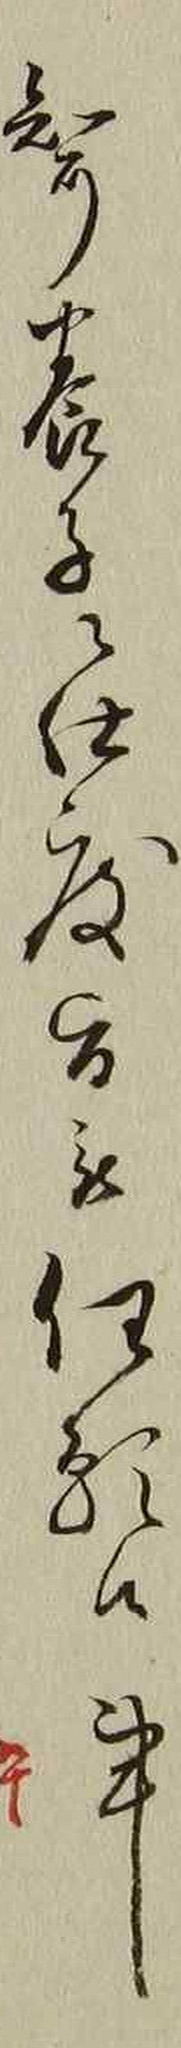婿養子に仕度旨被任願候事
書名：諸士系譜　巻之3　い之部3
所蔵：会津若松市立会津図書館
